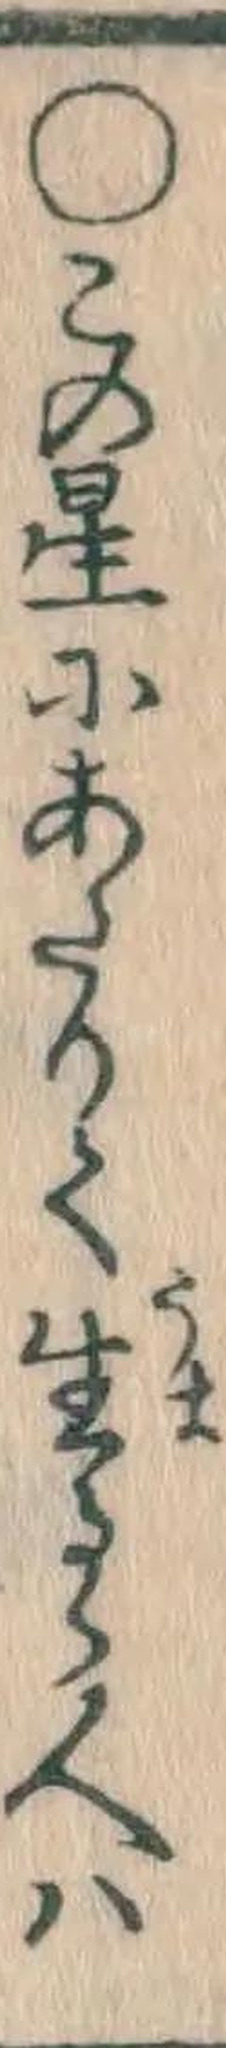○この星にあたりて生るゝ人は
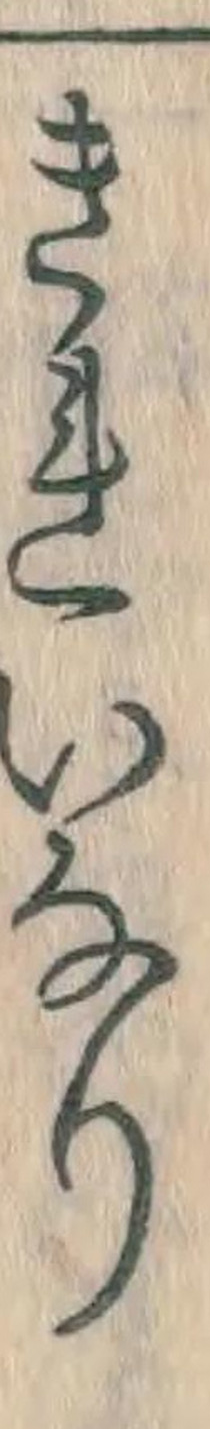きれいなり
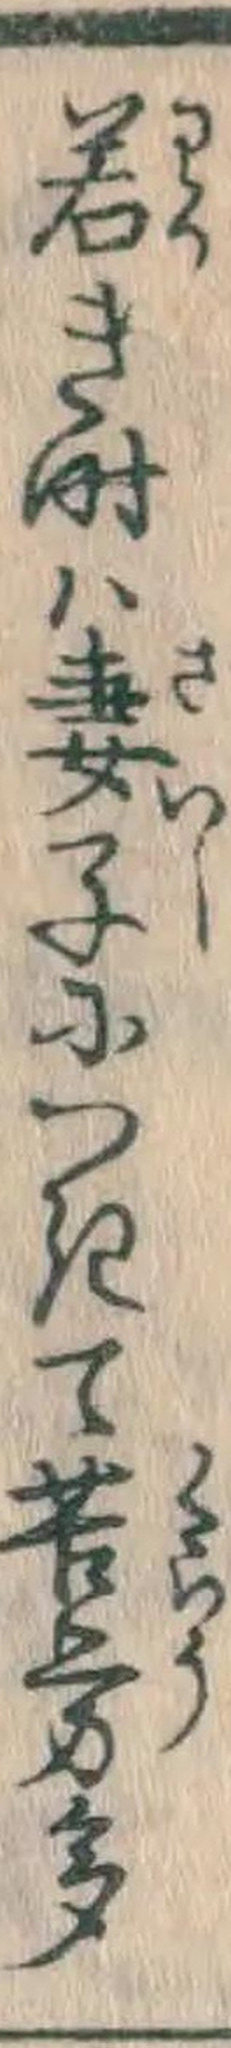若き時は妻子につきて苦労多
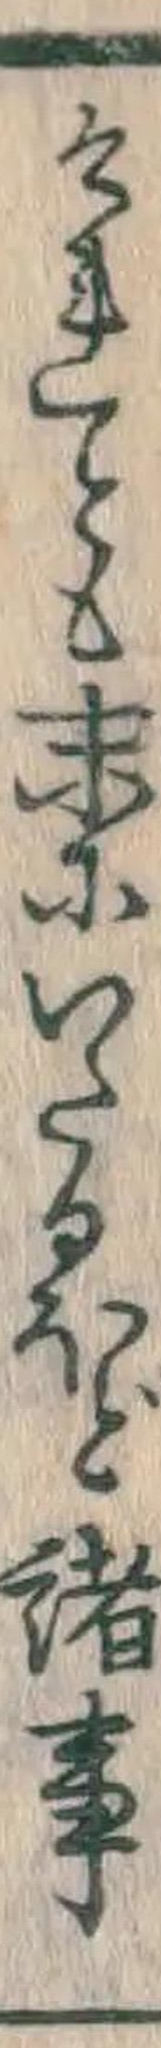けれとも末にいたるほど諸事
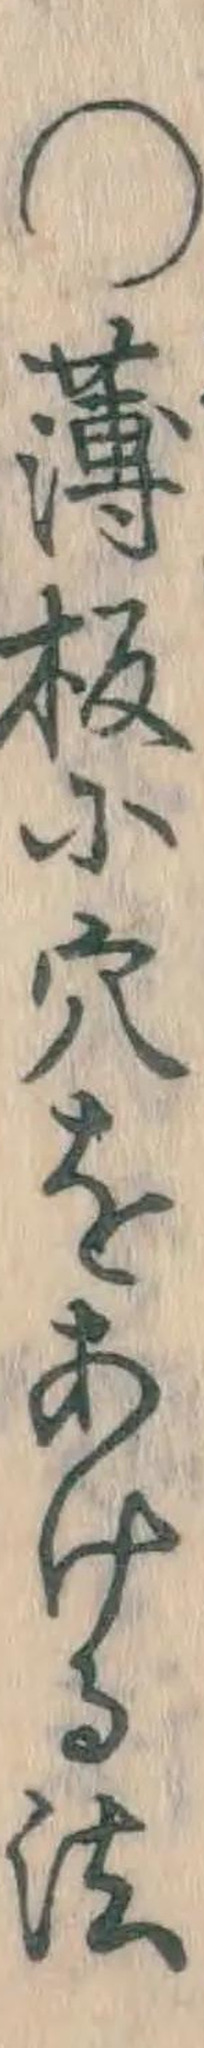○薄板に穴をあける法
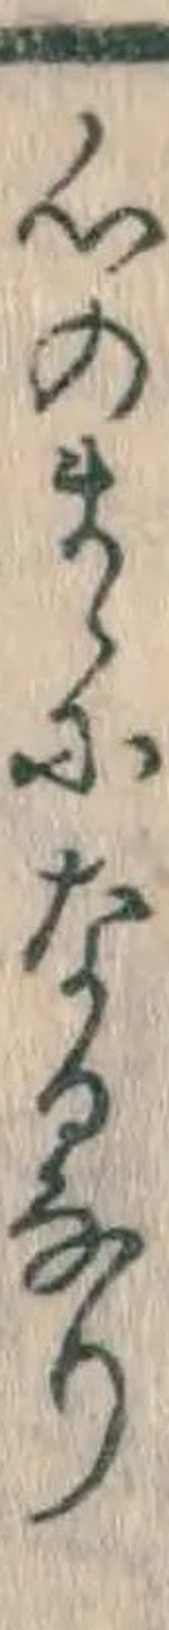心のまゝになるなり
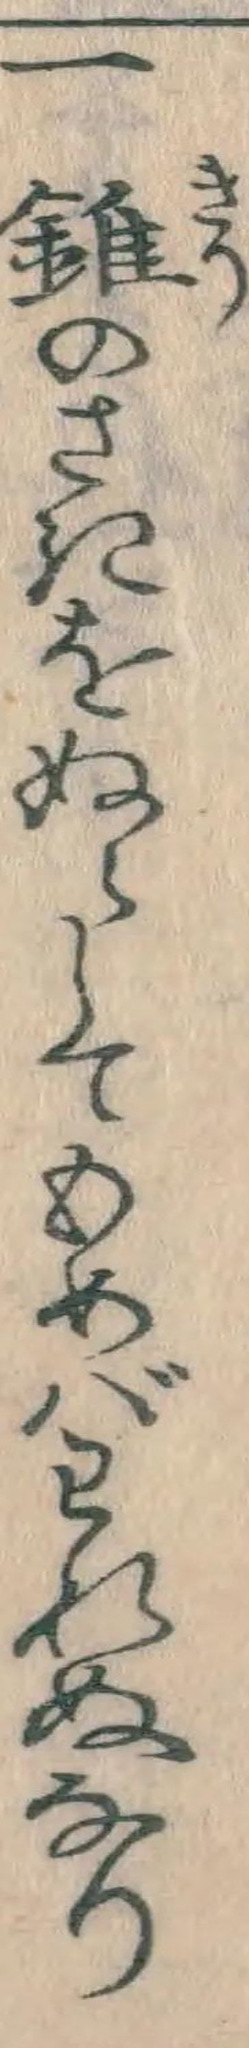一錐のさきをぬらしてもめばわれぬなり
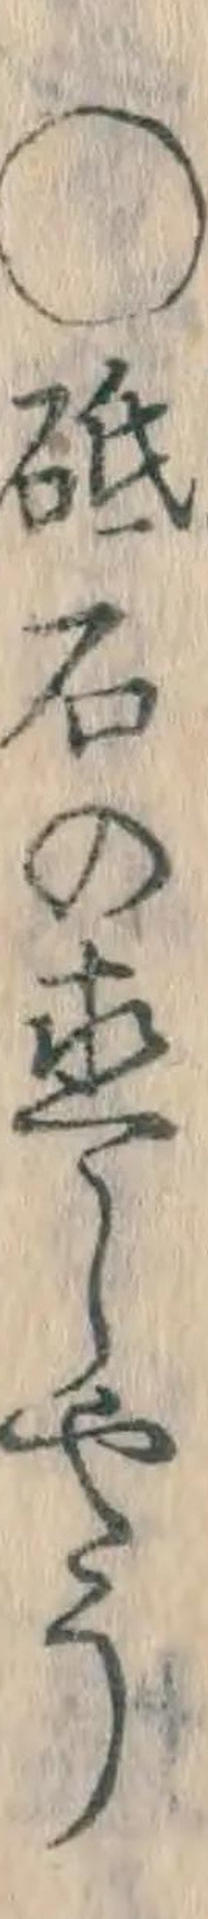○砥石の直しやう
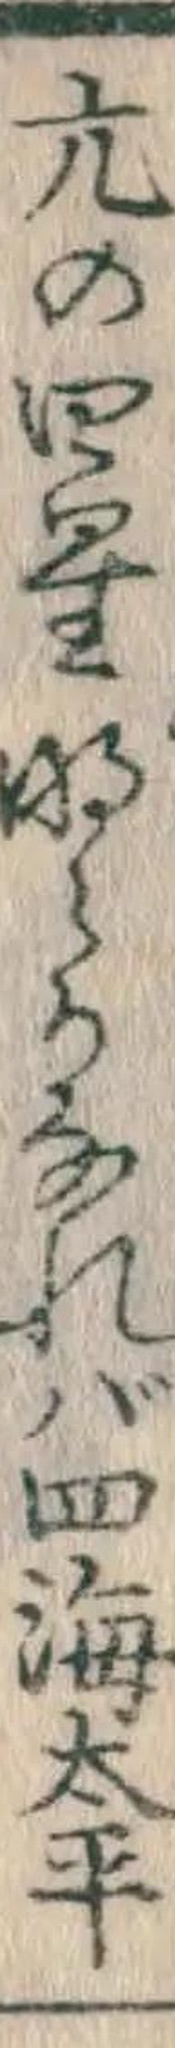亢の四星明らかなれば四海太平
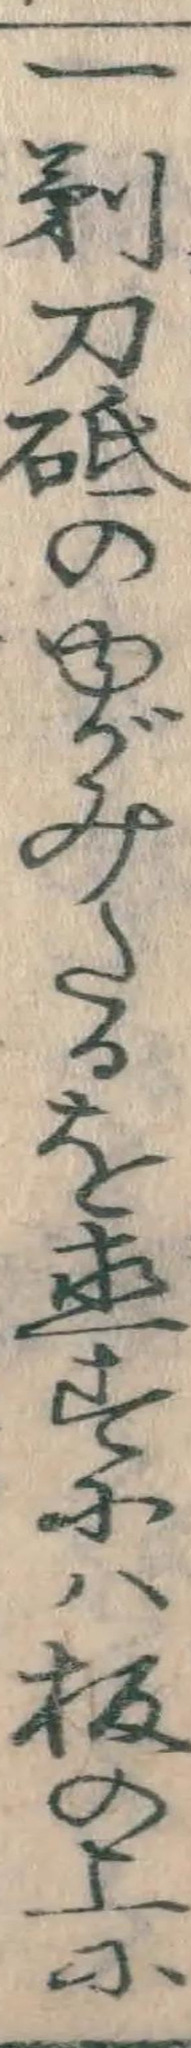一剃刀砥のゆがみたるを直すには板の上に
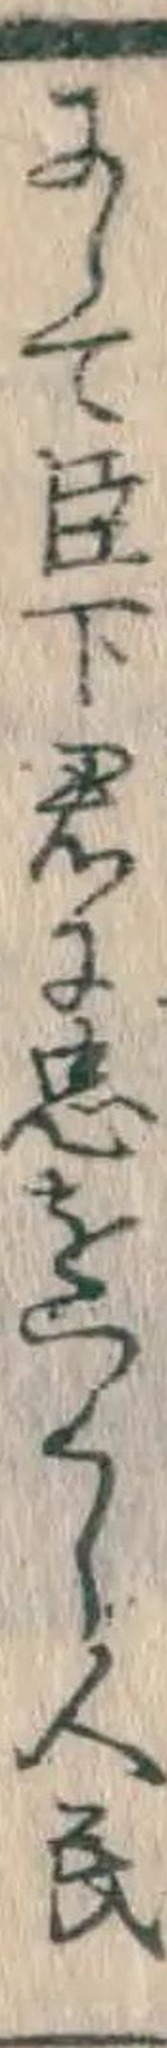にして臣下君に忠をつくし人民
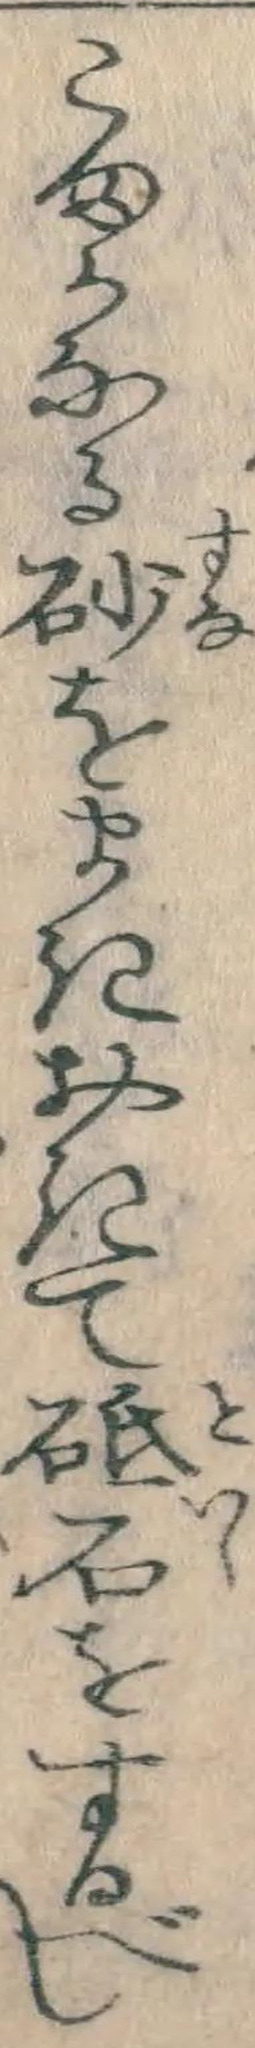こまかなる砂をまきおきて砥石をするべし
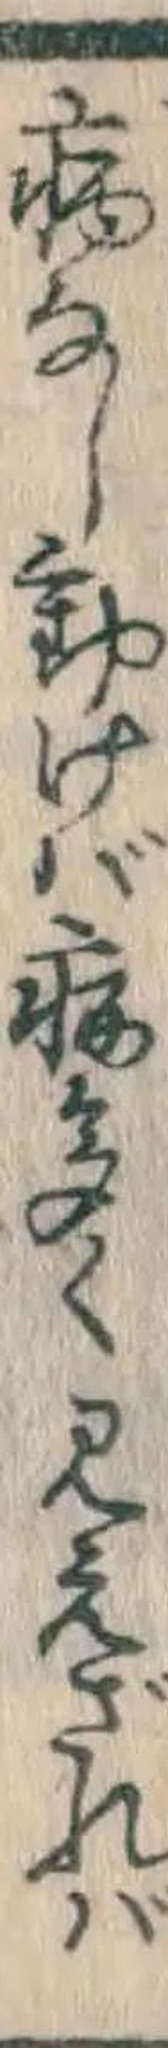病なし動けば病多く見えざれば
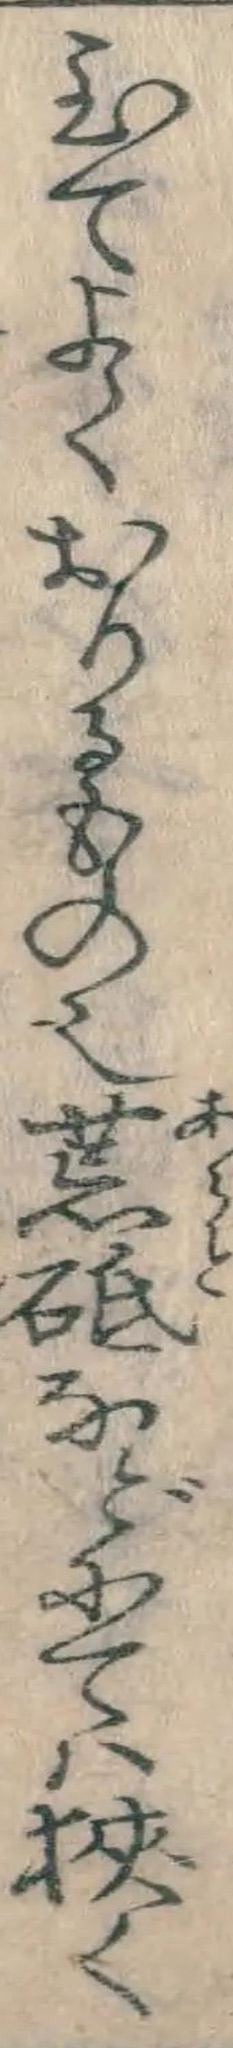至てよくおりるもの也荒砥などにては狭く
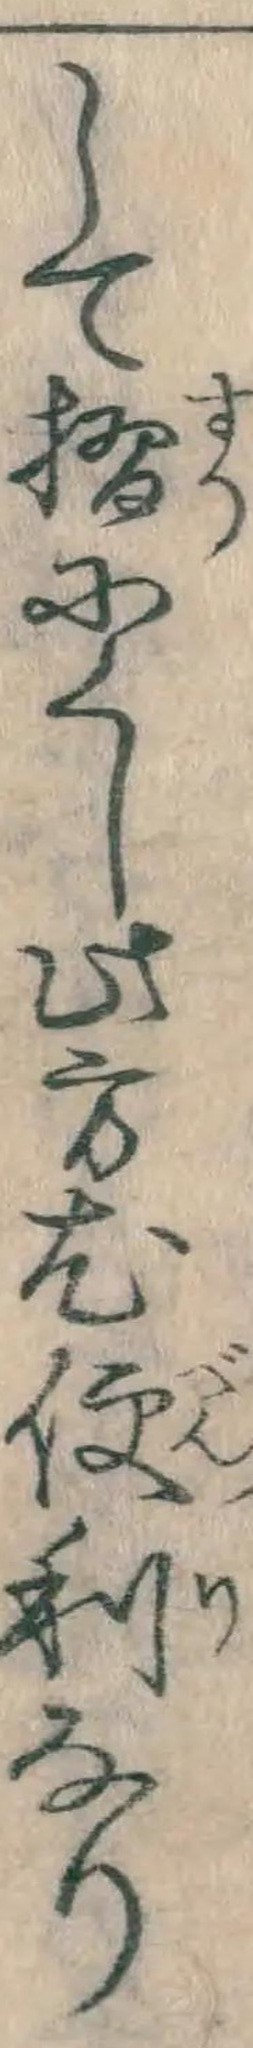して摺にくし此方尤便利なり
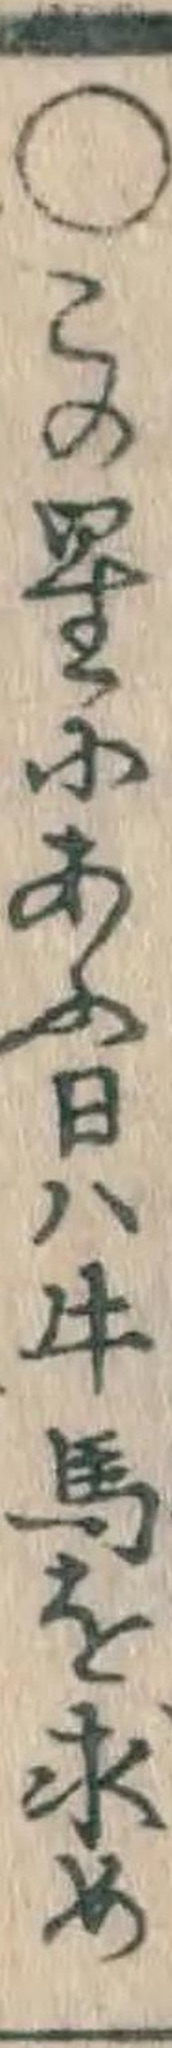○この星にあふ日は牛馬を求め
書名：広益秘事大全 3巻. [2]
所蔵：国立国会図書館 National Diet Library, JAPAN
